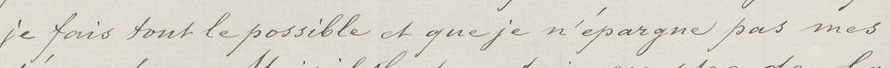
je fais tout le possible et que je n'épargne pas mes
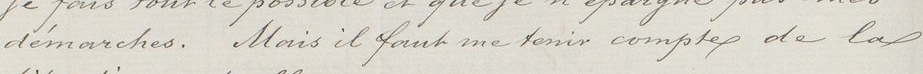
démarches. Mais il faut me tenir compte de la
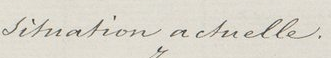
situation actuelle.
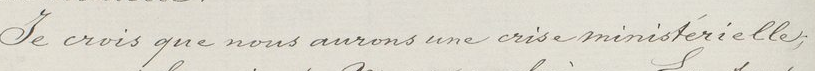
Je crois que nous aurons une crise ministérielle,
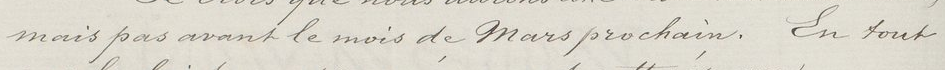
mais pas avant le mois de Mars prochain. En tout
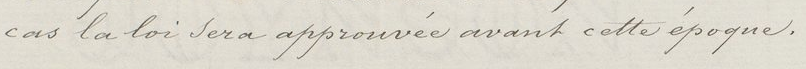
cas la loi sera approuvée avant cette époque.
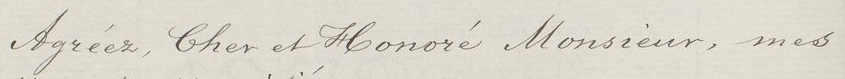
Agréez, Cher et Honoré Monsieur, mes
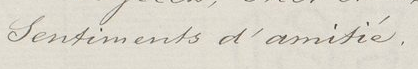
Sentiments d'amitié.
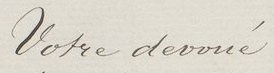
Votre dévoué
